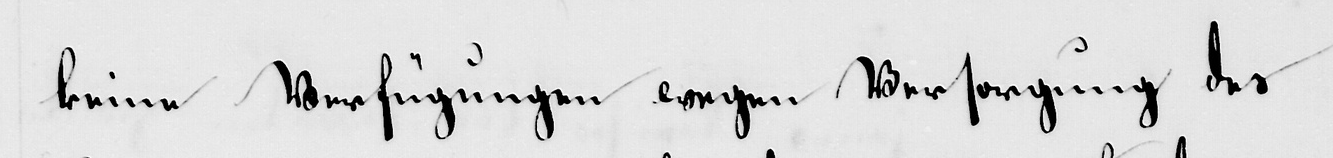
keine Verfügungen wegen Versorgung des
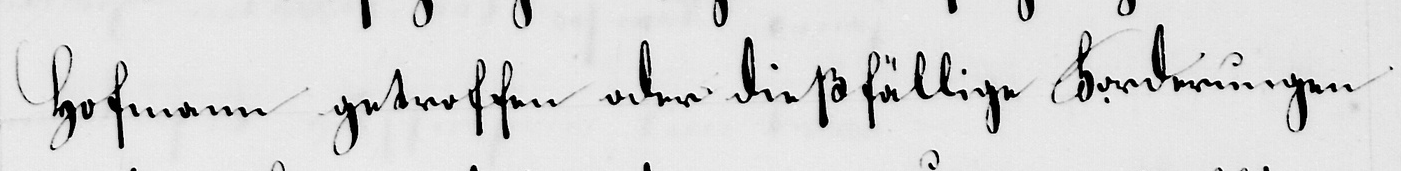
Hofmann getroffen oder dießfällige Forderungen
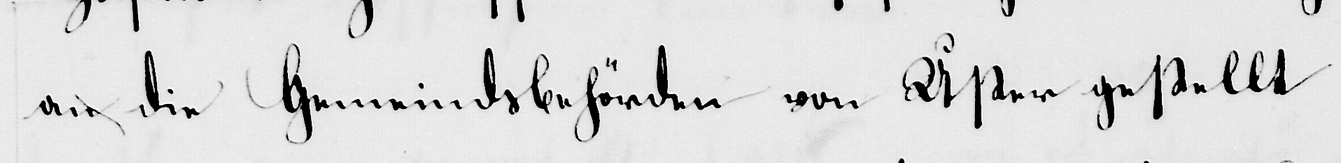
an die Gemeindsbehörden von Uster gestellt
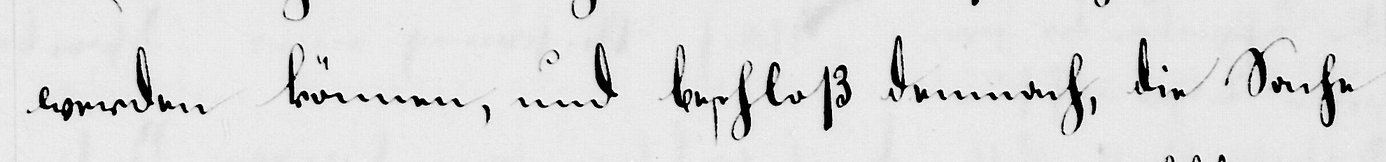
werden können, und beschloß demnach, die Sache
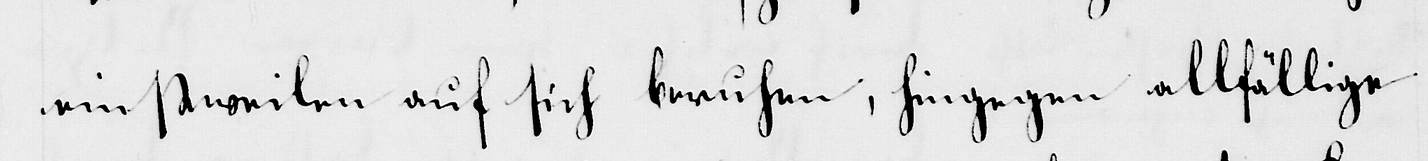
einstweilen auf sich beruhen, hingegen allfällige
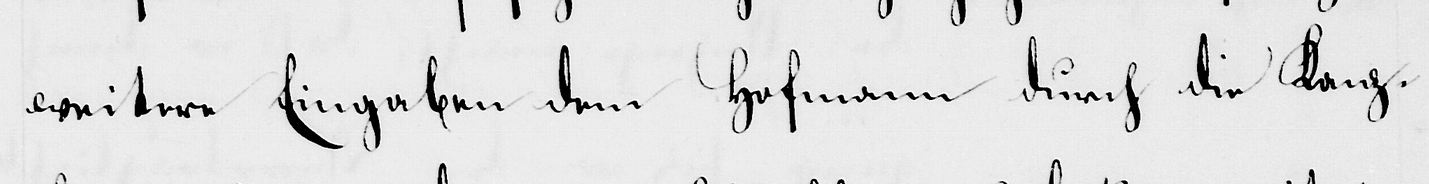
weitere Eingaben dem Hofmann durch die Kanz¬
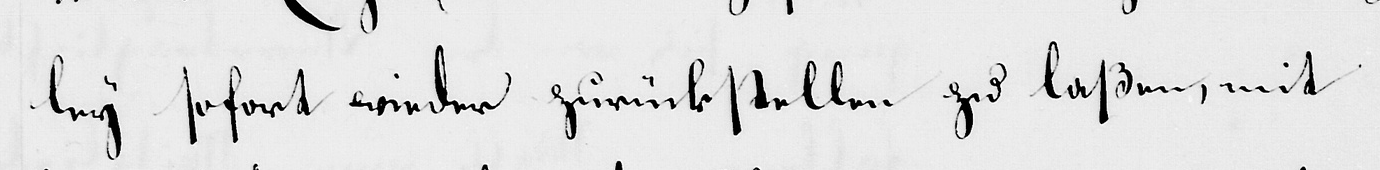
ley sofort wieder zurückstellen zu laßen, mit
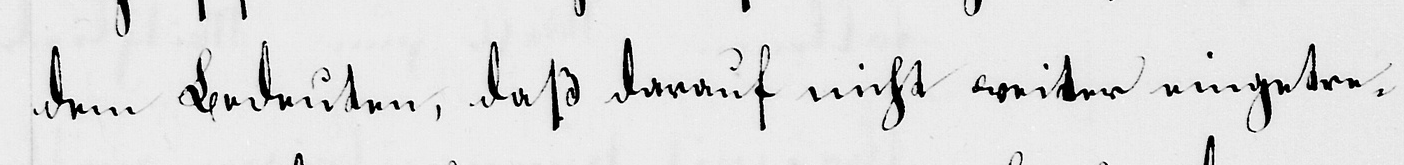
dem Bedeuten, daß darauf nicht weiter eingetre¬
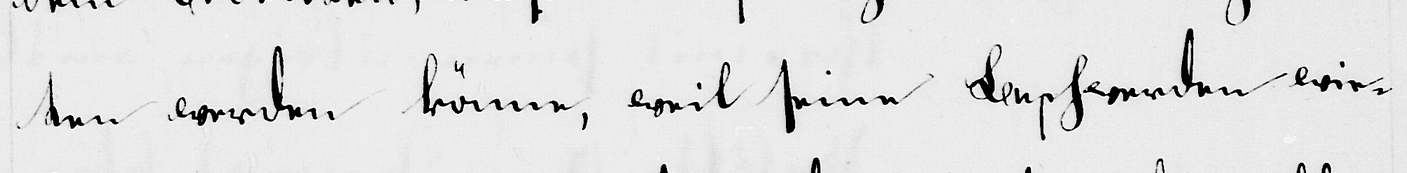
ten werden könne, weil seine Beschwerden wie¬
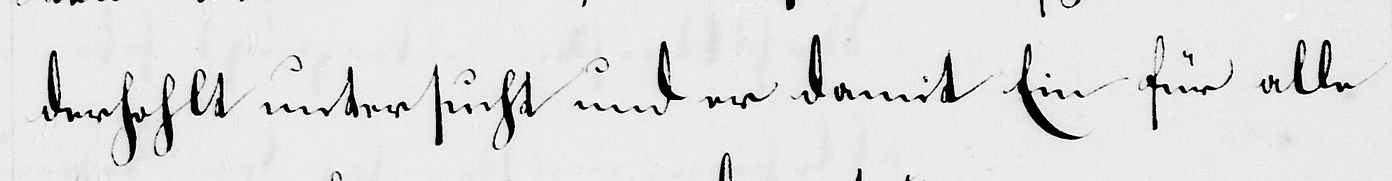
derhohlt untersucht und er damit Ein für alle
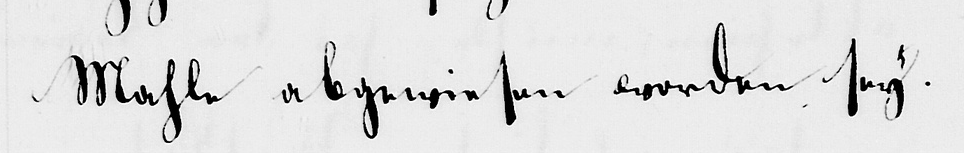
Mahle abgewiesen worden sey.
